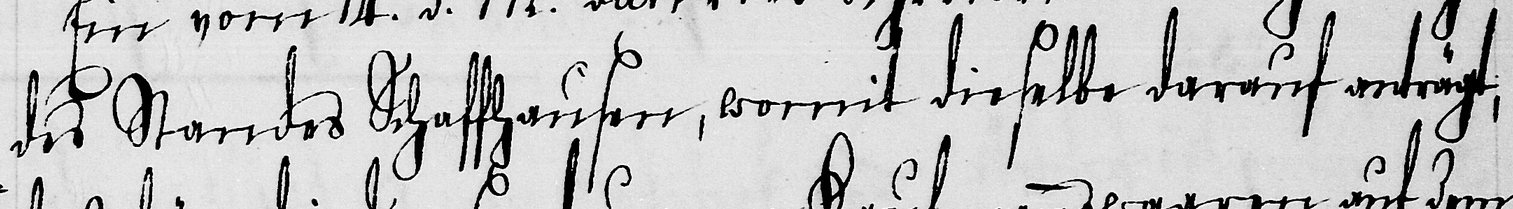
des Standes Schaffhausen, womit dieselbe darauf anträg¬
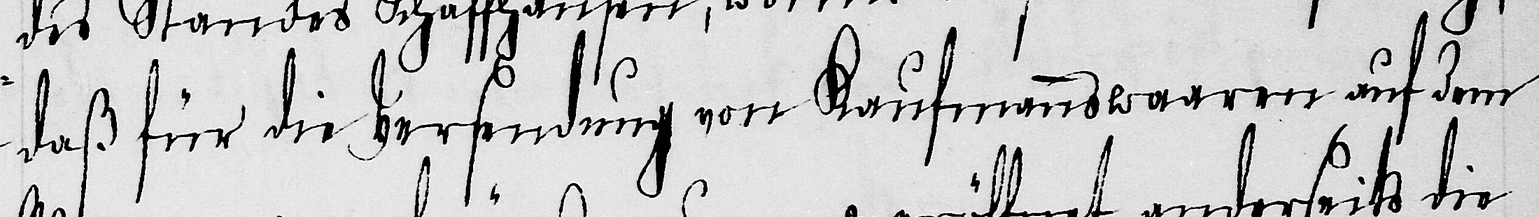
daß für die Versendung von Kaufmannswaaren auf dem
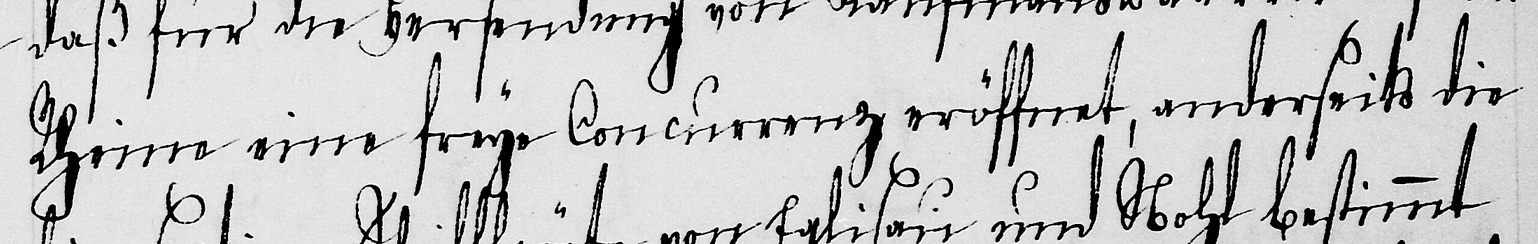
Rheine eine freye Concurrenz eröffnet, anderseits die
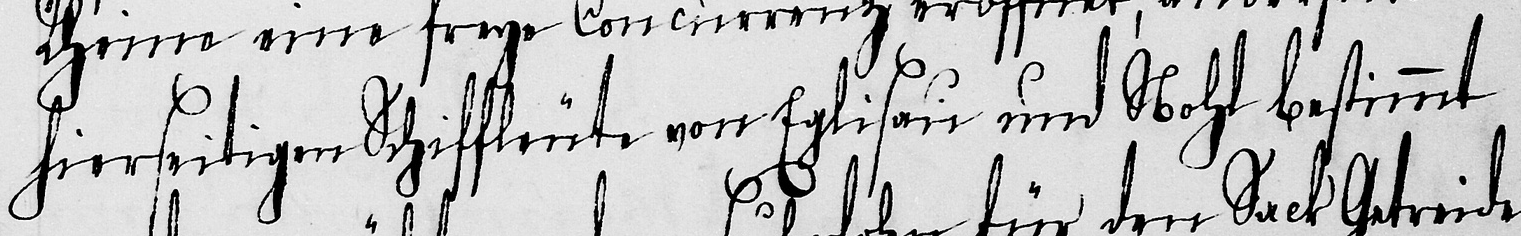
hierseitigen Schiffleute von Eglisau und Nohl bestimmt
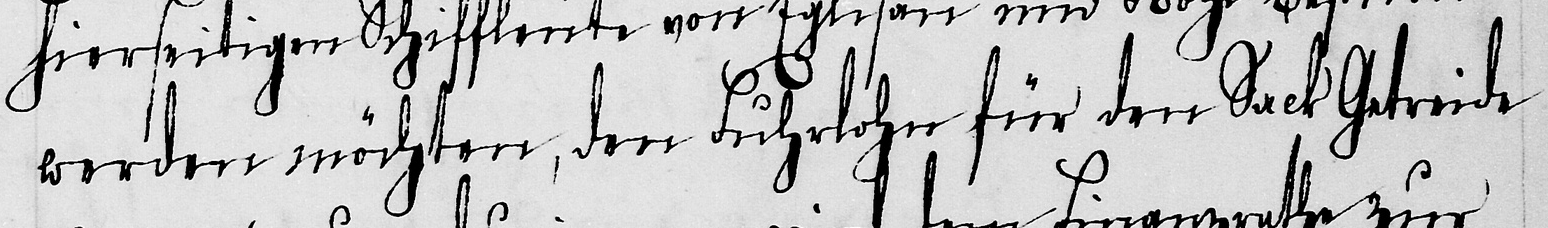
werden möchte, den Fuhrlohn für den Sack Getreide
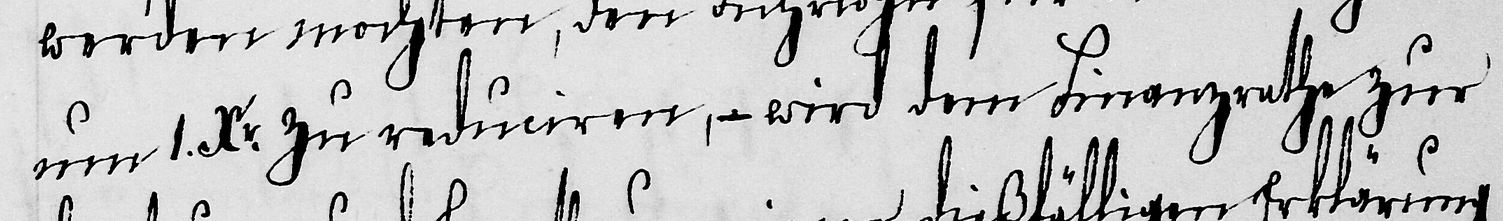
um 1. Xr. zu reduciren, – wird dem Finanzrathe zur
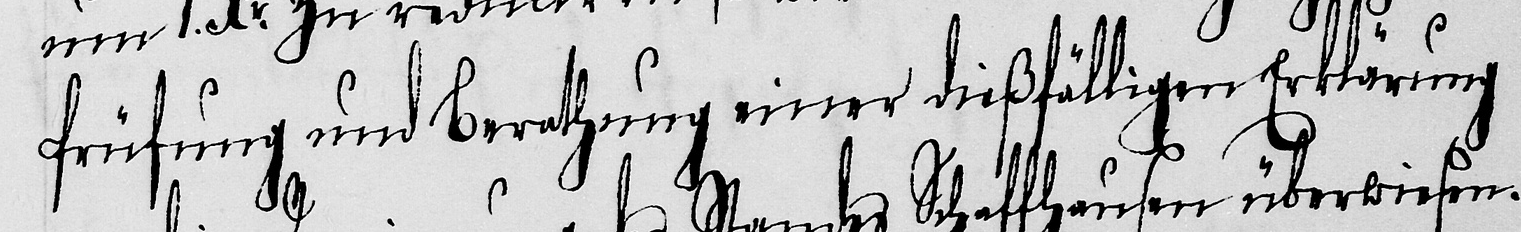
Prüfung und Berathung einer dießfälligen Erklärung
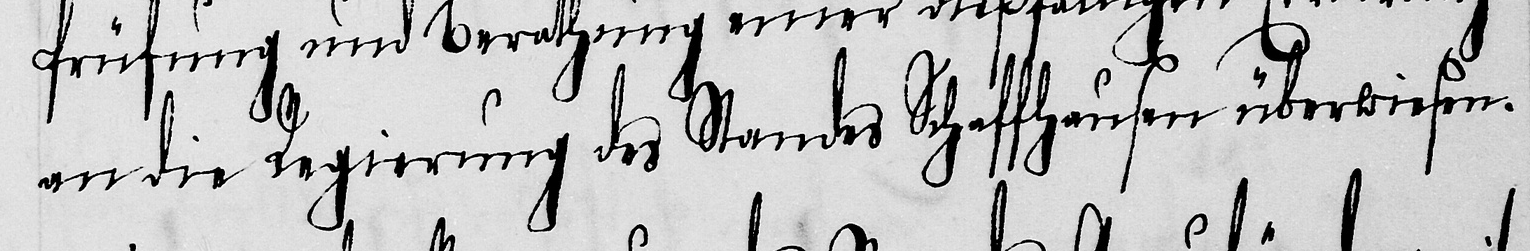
an die Regierung des Standes Schaffhausen überwiesen.
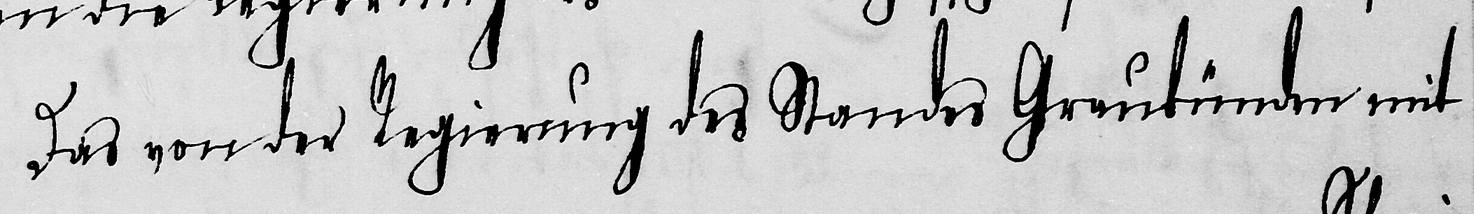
Das von der Regierung des Standes Graubünden mit
